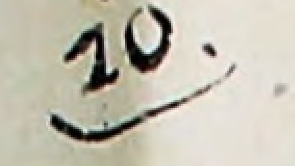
10.
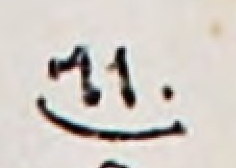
11.
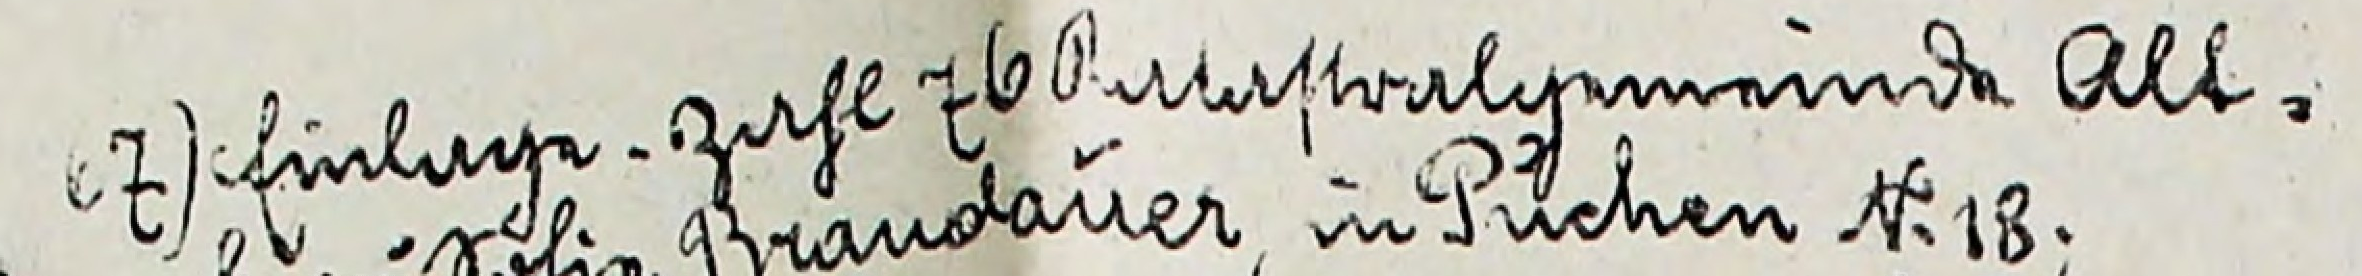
67) Einlage - Zahl 76 Katastralgemeinde Alt=
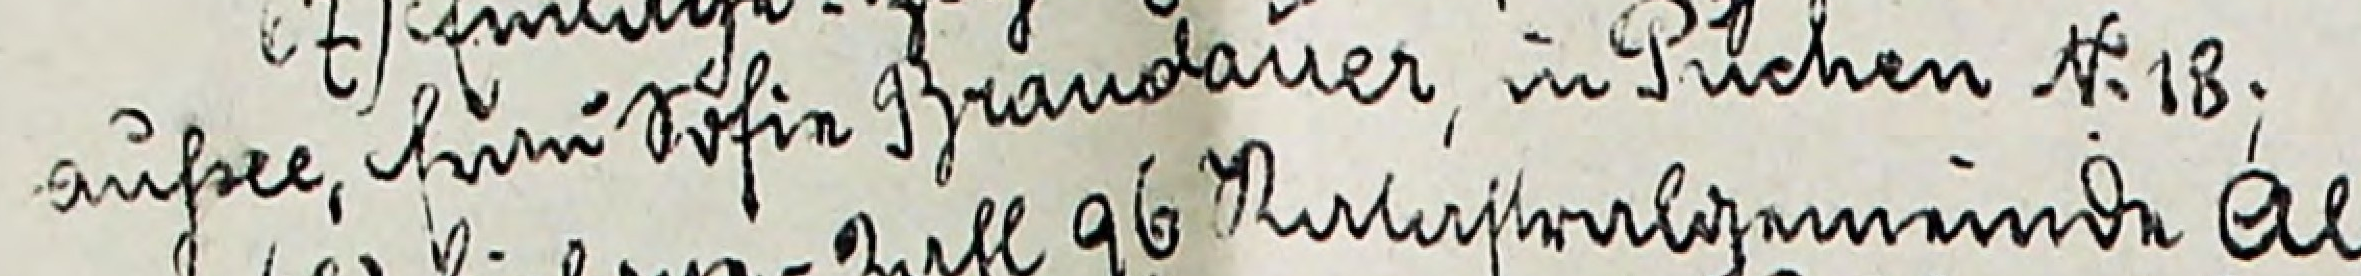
aussee, Frau Sofie Brandauer, in Puchen № 18;
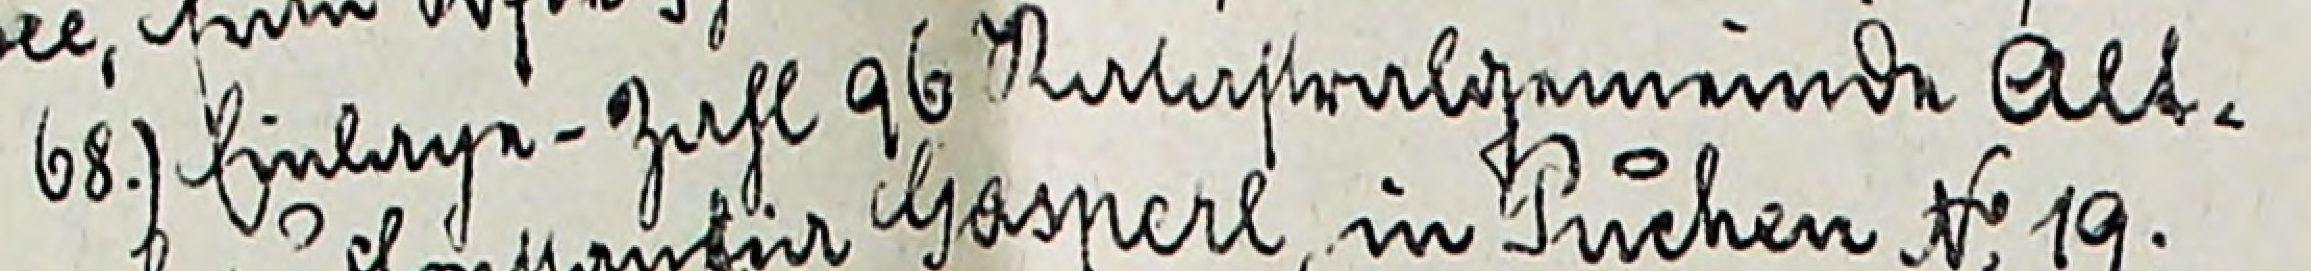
68.) Einlage - Zahl 96 Katastralgemeinde Alt=
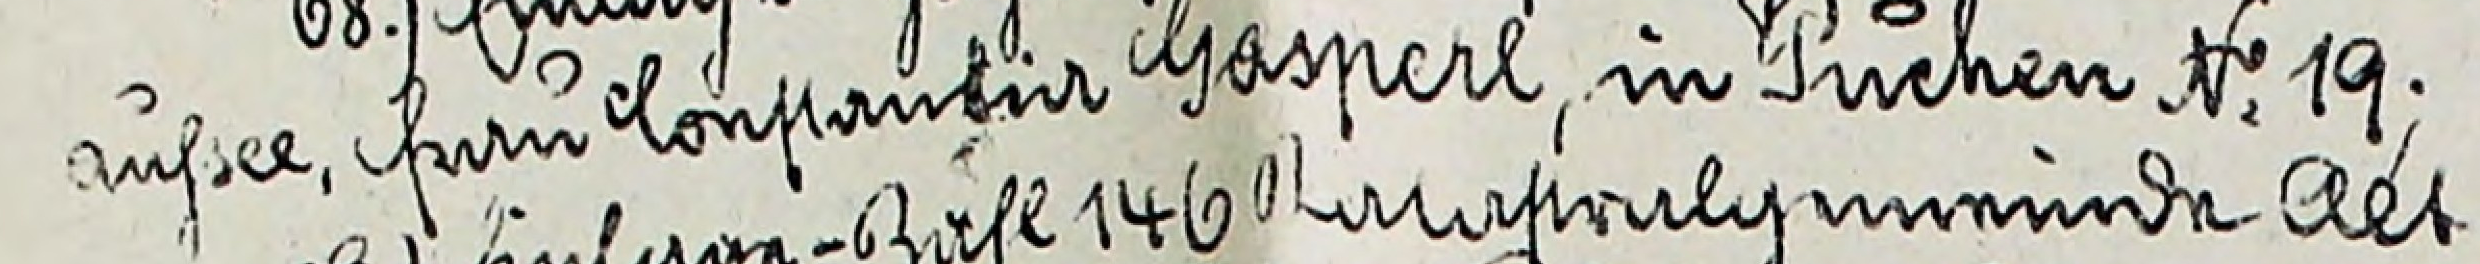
aussee, Frau Constantia Gasperl, in Puchen № 19;
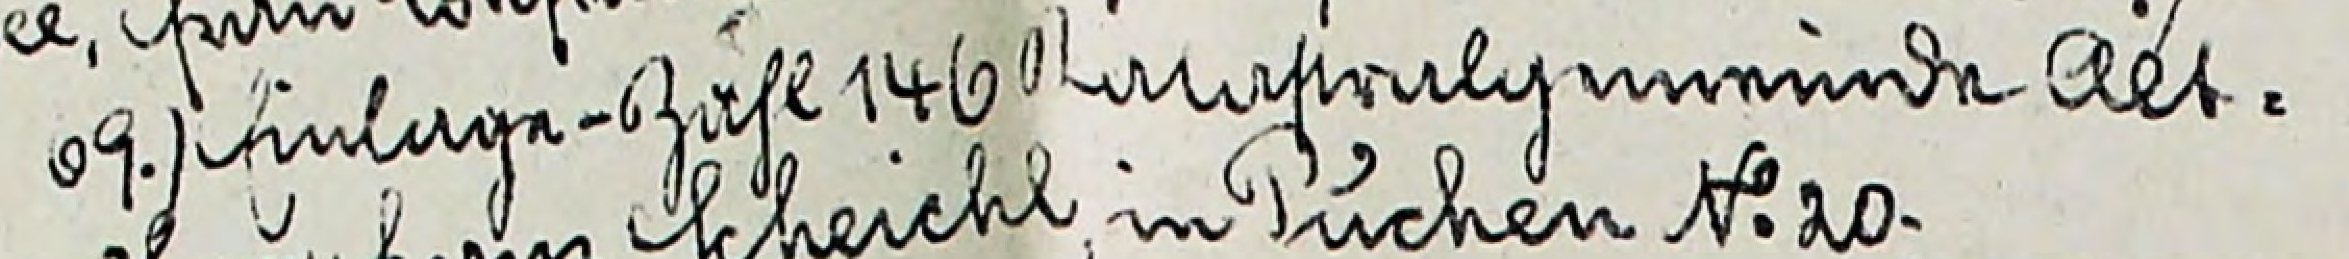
69.) Einlage - Zahl 146 Katastralgemeinde Alt=
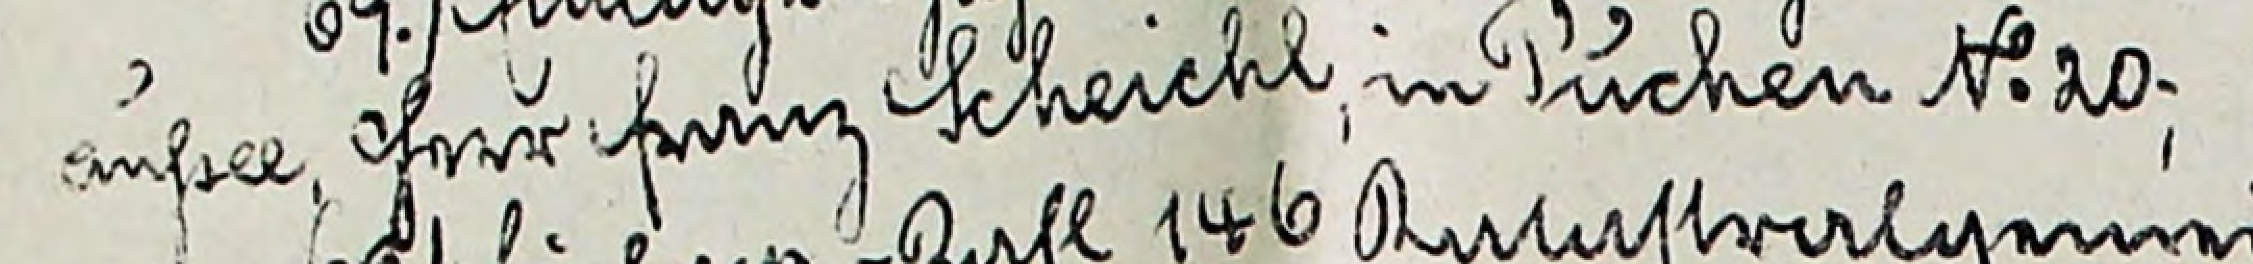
aussee, Herr Franz Scheichl, in Puchen № 20;
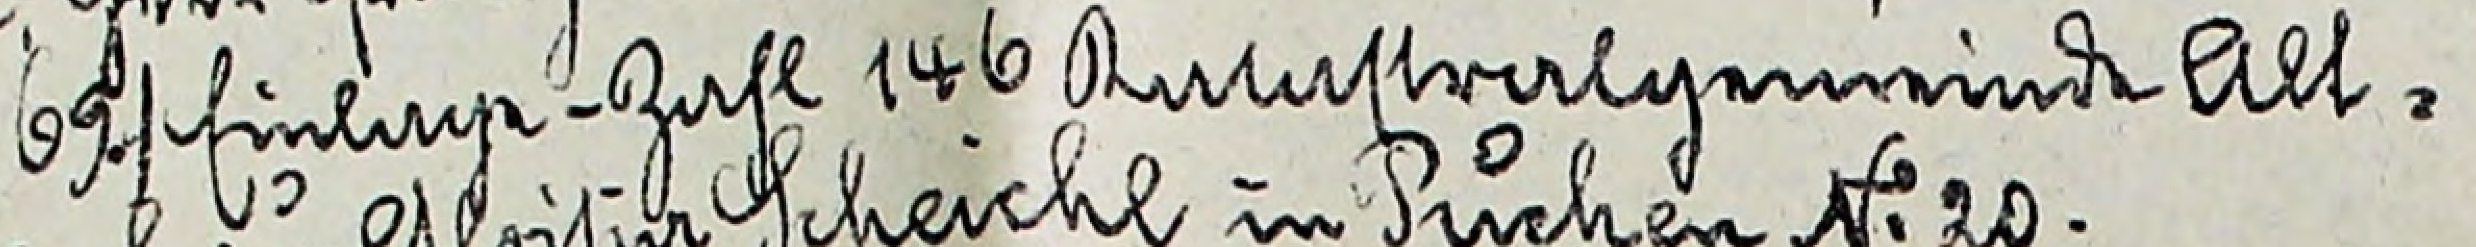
69.) Einlage - Zahl 146 Katastralgemeinde Alt=
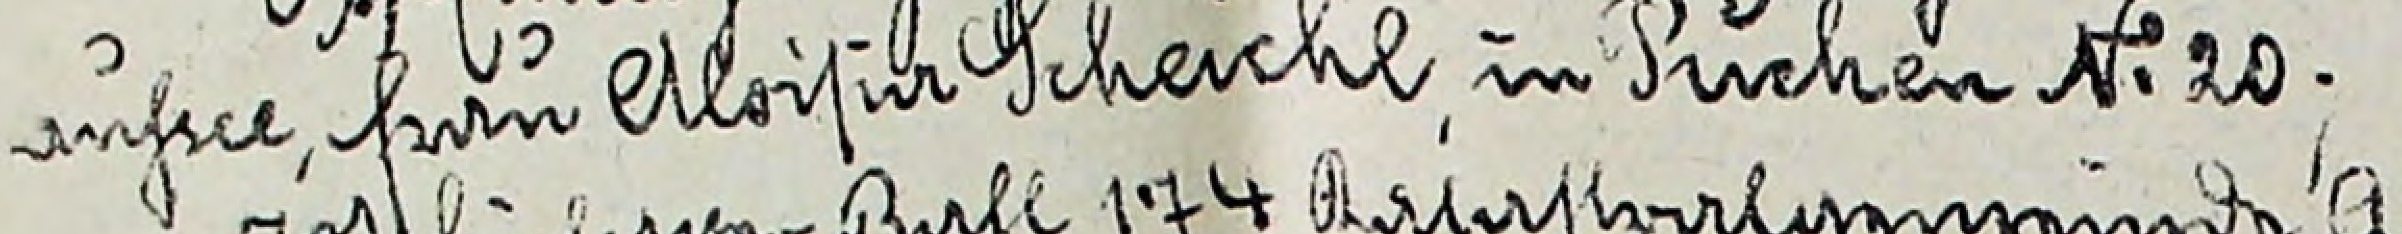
aussee, Frau Aloisia Scheichl, in Puchen № 20;
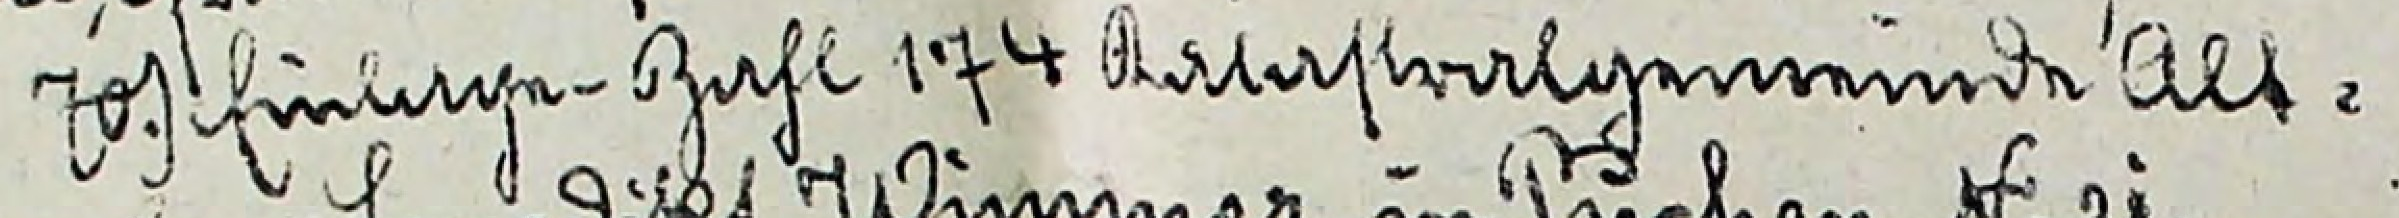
70.) Einlage - Zahl 174 Katastralgemeinde Alt=
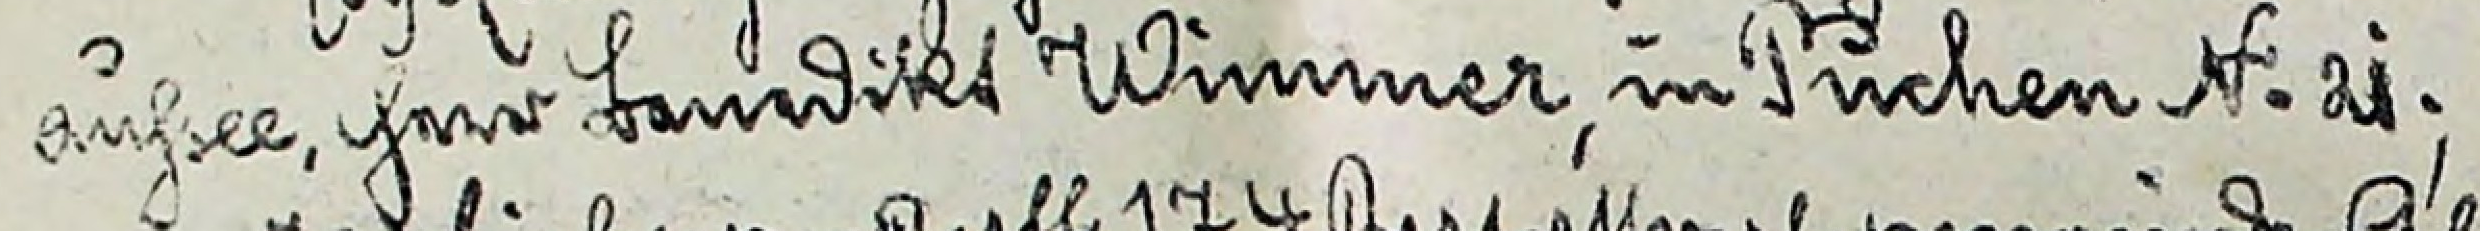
aussee, Herr Benedikt Wimmer, in Puchen № 21;
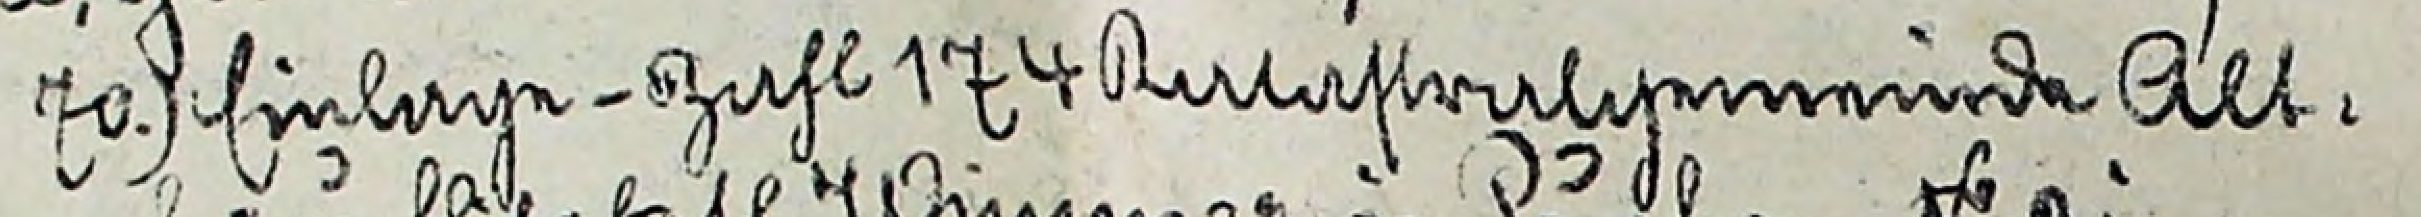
70.) Einlage - Zahl 174 Katastralgemeinde Alt=
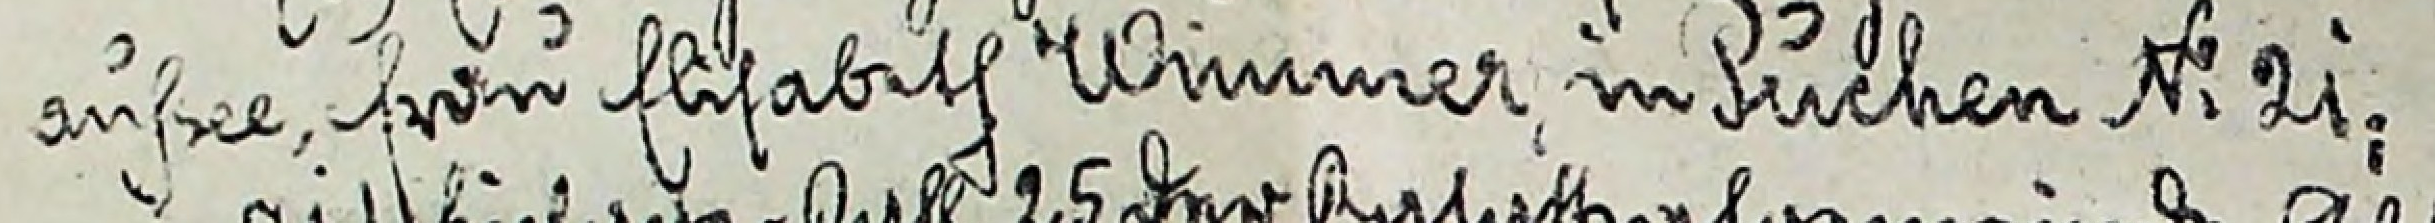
aussee, Frau Elisabeth Wimmer, in Puchen № 21;
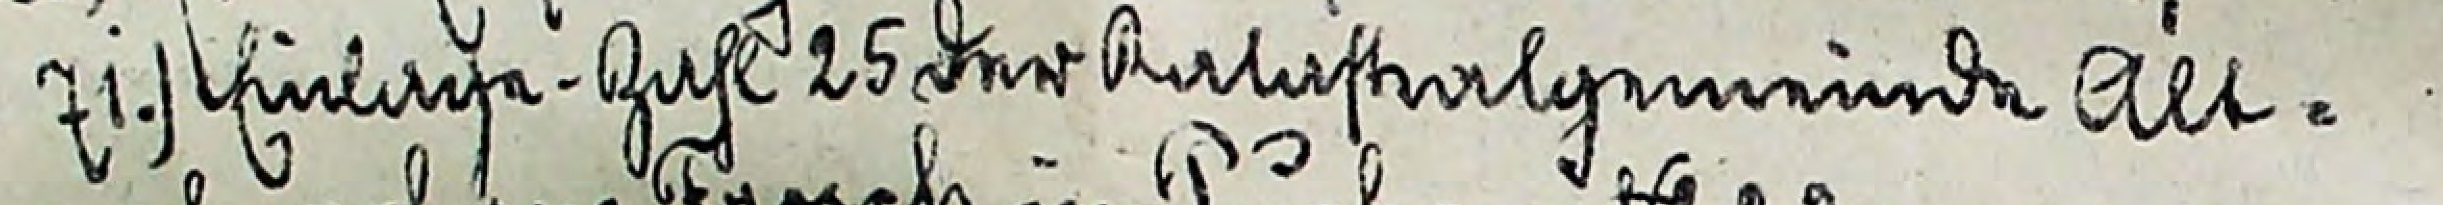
71.) Einlage - Zahl 25 der Katastralgemeinde Alt=
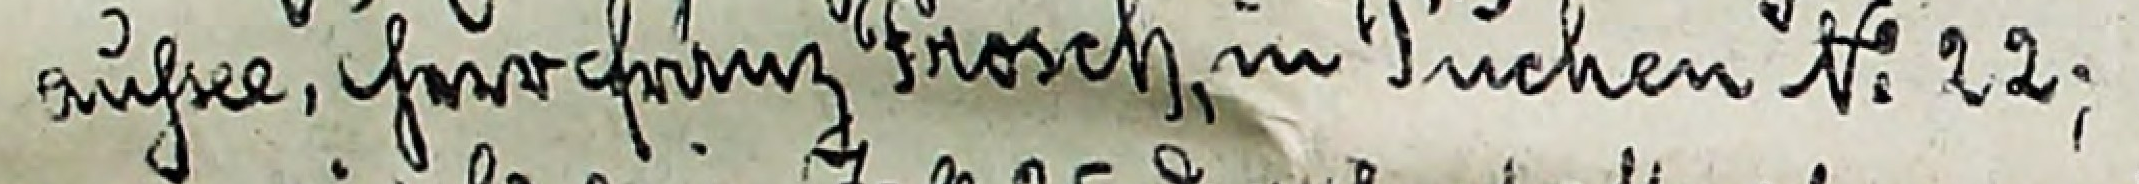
aussee, Herr Franz Frosch, in Puchen № 22;
